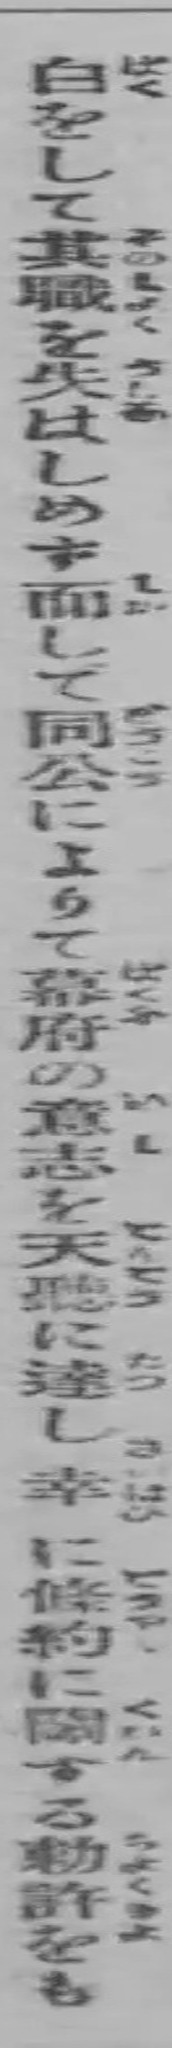白をして其職を失はしめず而して同公によりて幕府の意志を天聴に達し幸に条約に関する勅許をも
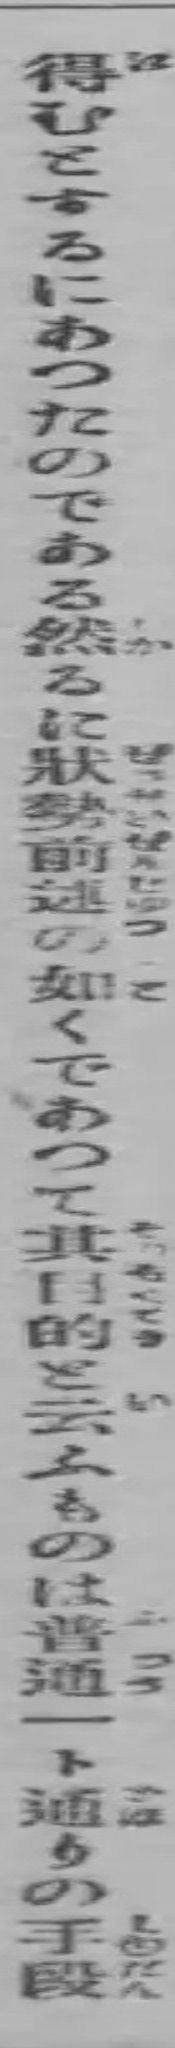得むとするにあつたのである然るに状勢前述の如くであつて其目的と云ふものは普通一ト通りの手段
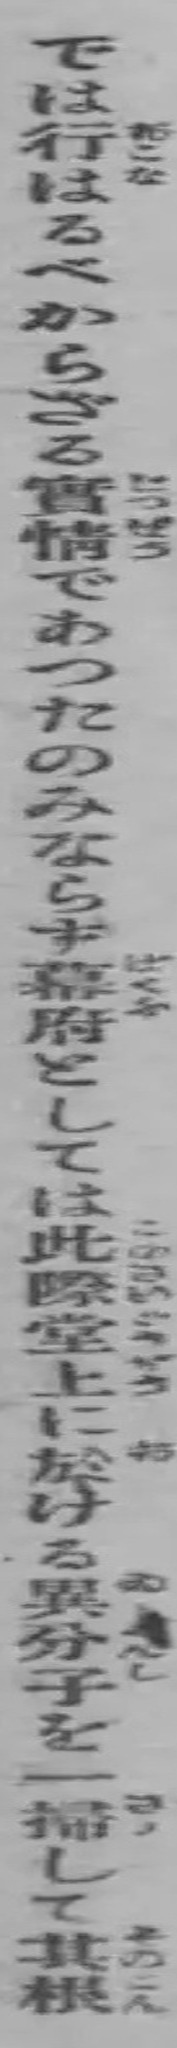では行はるべからざる実情であつたのみならず幕府としては此際堂上に於ける異分子を一掃して其根

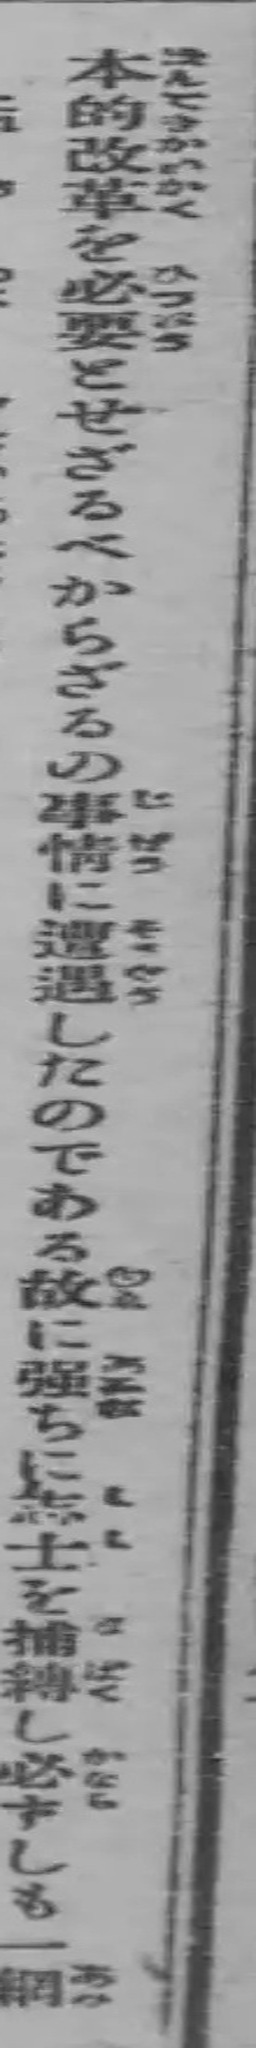本的改革を必要とせざるべからざるの事情に遭遇したのである故に強ちに志士を捕縛し必ずしも一網
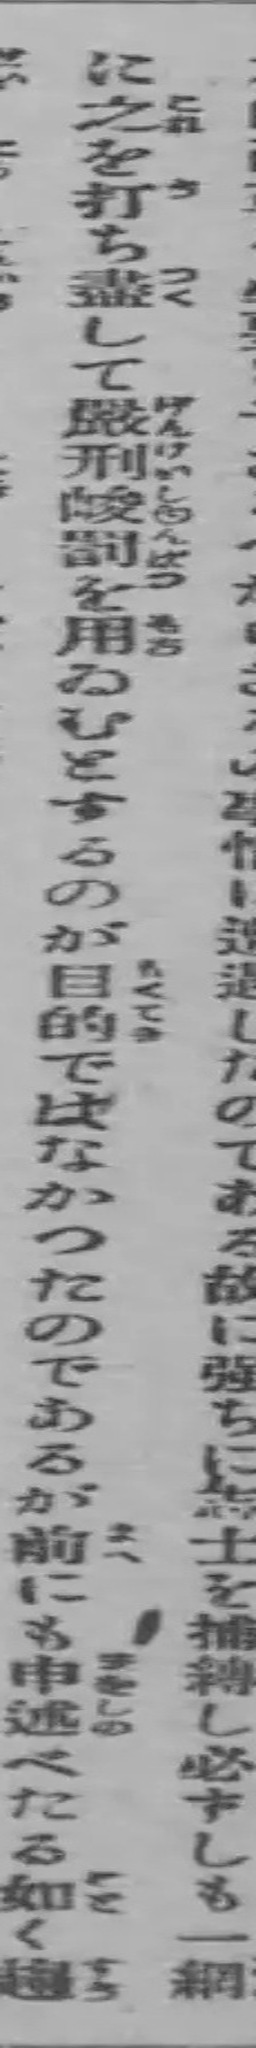に之を打ち尽して厳刑峻罰を用ゐむとするのが目的ではなかつたのであるが前にも申述べたる如く趨
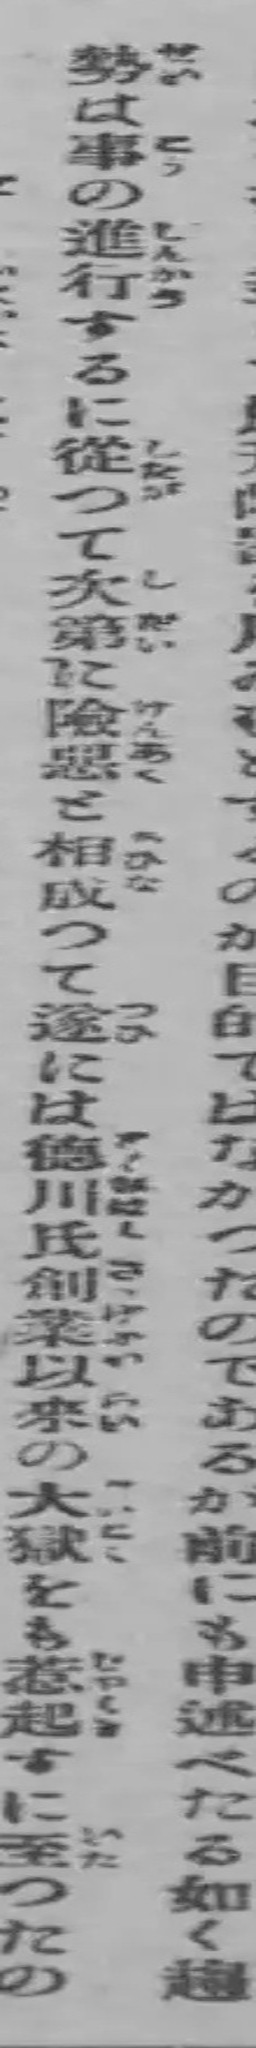勢は事の進行するに従つて次第に険悪と相成つて遂には徳川氏創業以来の大獄をも惹起すに至つたの
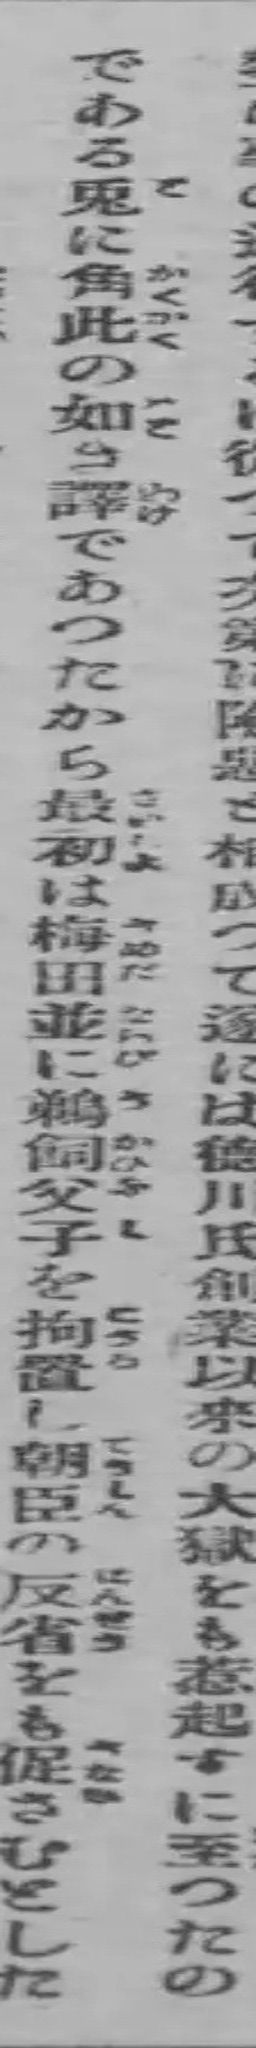である兎に角此の如き訳であつたから最初は梅田並に鵜飼父子を拘置し朝臣の反省をも促さむとした
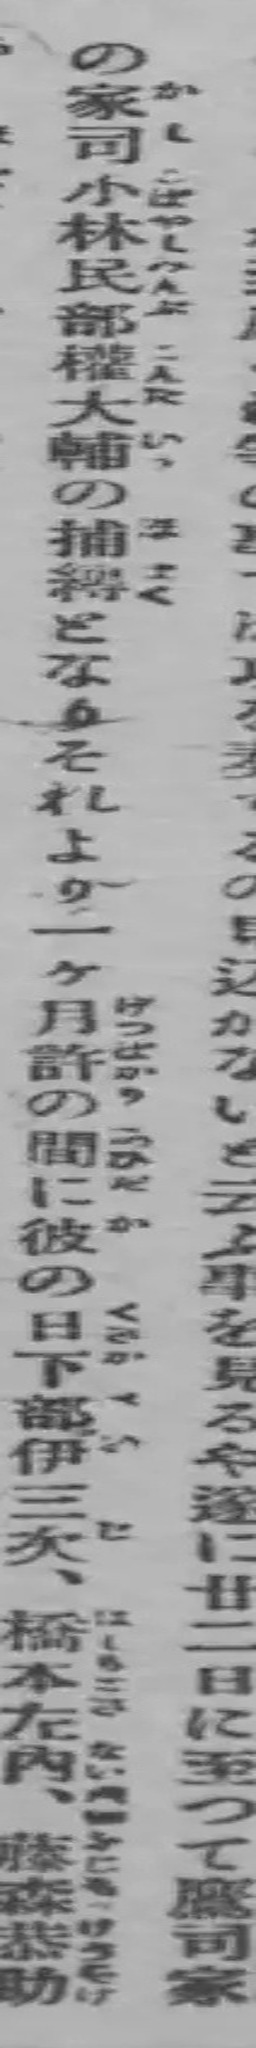の家司小林民部権大輔の捕縛となりそれより一ヶ月許の間に彼の日下部伊三次、橋本左内、藤森恭助
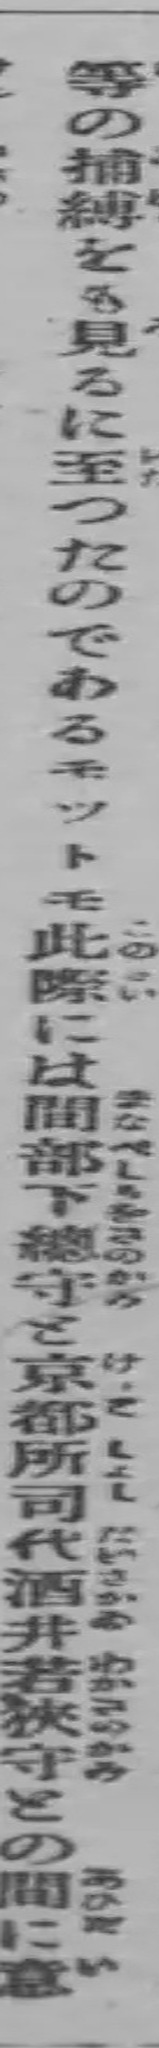等の捕縛をも見るに至つたのであるモツトモ此際には間部下総守と京都所司代酒井若狭守との間に意
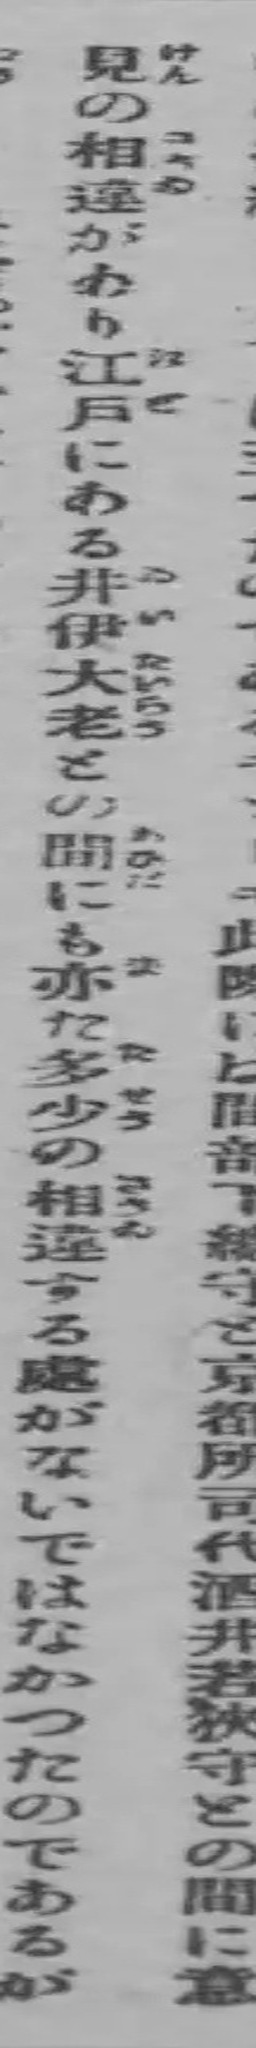見の相違があり江戸にある井伊大老との間にも亦た多少の相違する処がないではなかつたのであるが
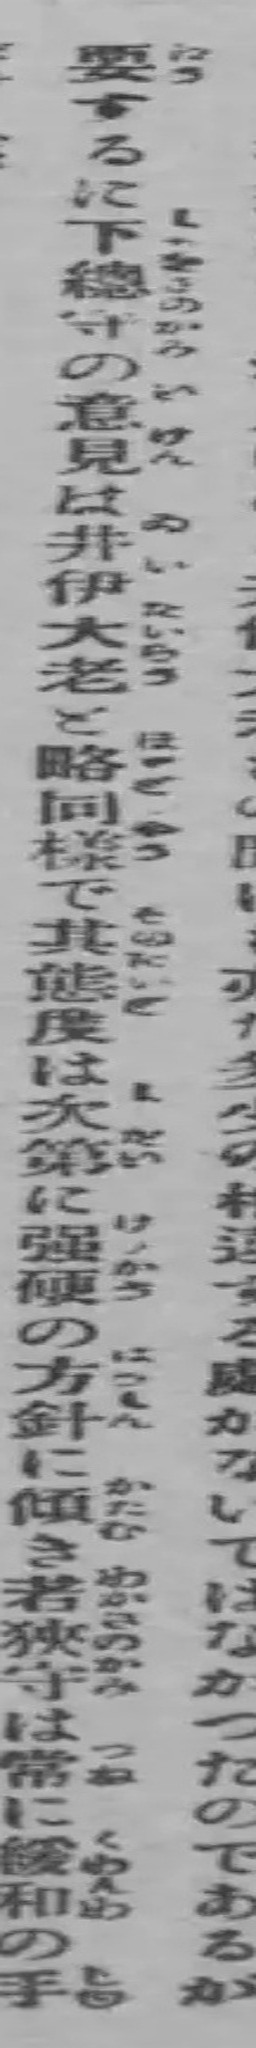要するに下総守の意見は井伊大老と略同様で其態度は次第に強硬の方針に傾き若狭守は常に緩和の手
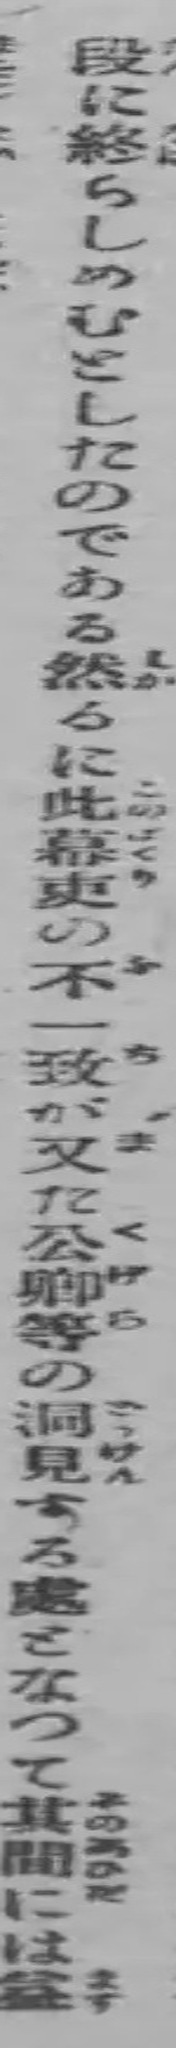段に終らしめむとしたのである然るに此幕吏の不一致が又た公卿等の洞見する処となつて其間には益
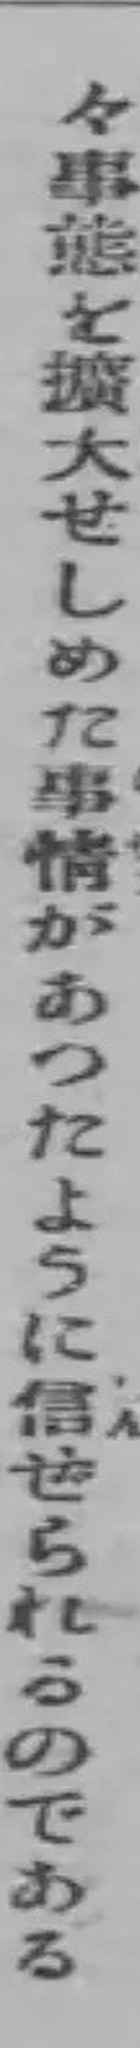益事態を拡大せしめた事情があつたように信ぜられるのである
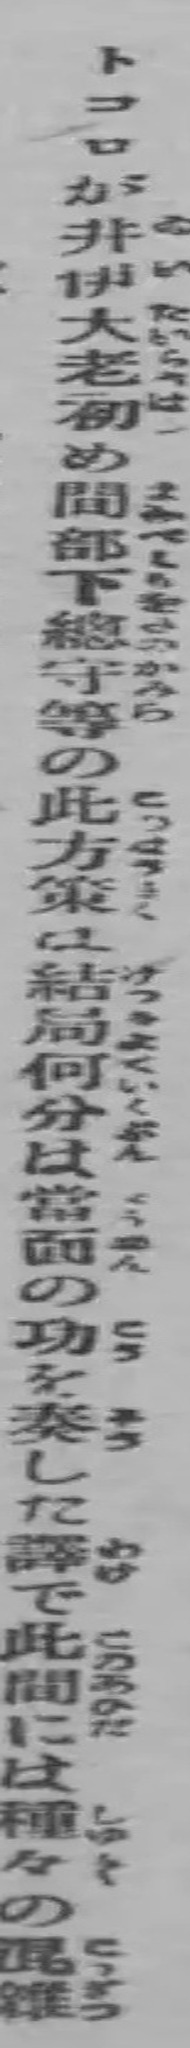トコロが井伊大老初め間部下総守等の此方策は結局何分は当面の功を奏した訳で此間には種々の混雑
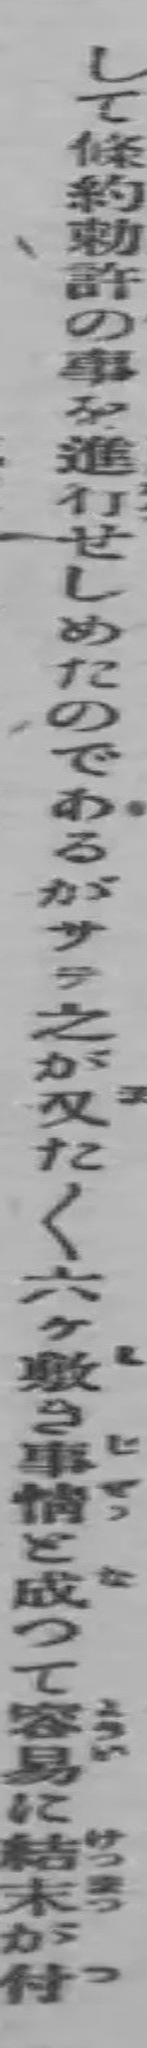して条約勅許の事を進行せしめたのであるがサテ之が又た〳〵六ケ敷き事情と成つて容易に結末が付
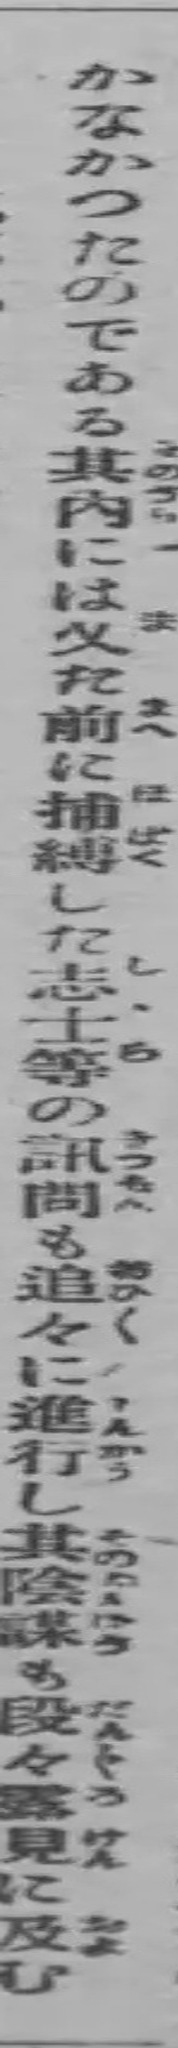かなかつたのである其内には又た前に捕縛した志士等の訊問も追々に進行し其陰謀も段々露見に及む
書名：豊橋市史談
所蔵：国立国会図書館 National Diet Library, JAPAN
